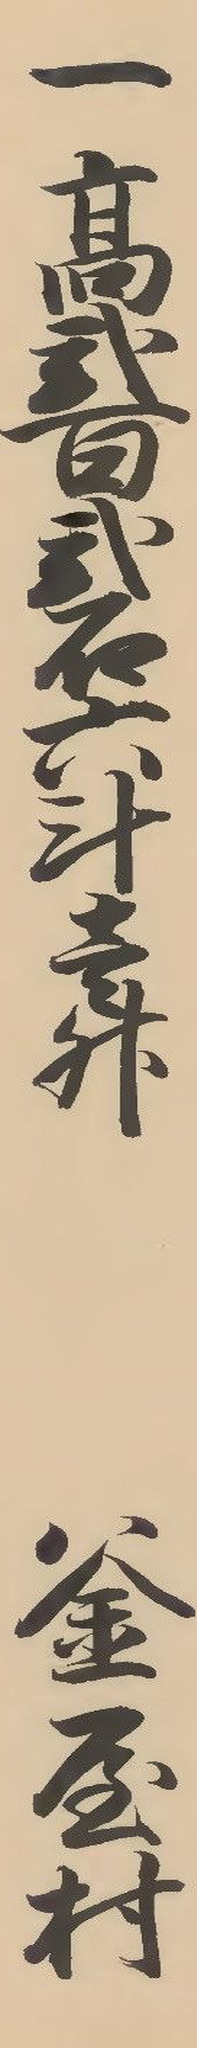一髙弐百弐石六斗壱升釜屋村
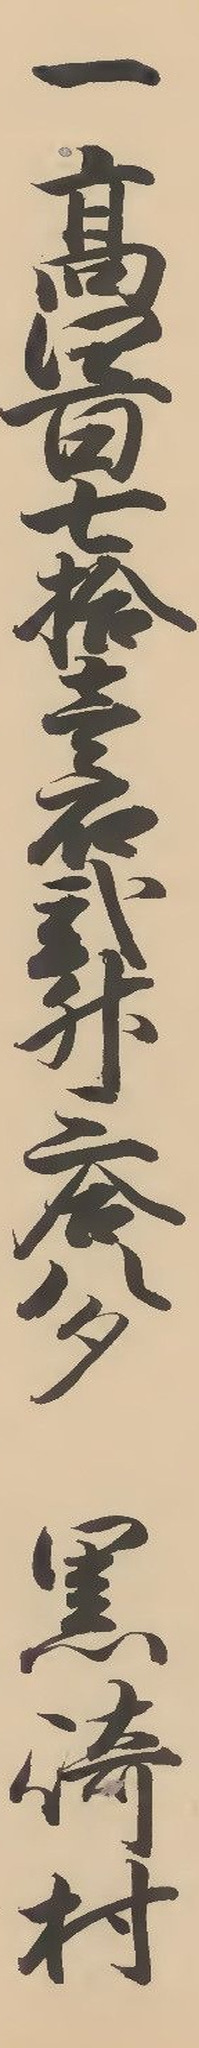一髙四百七拾壱石弐升三合八夕黒崎村
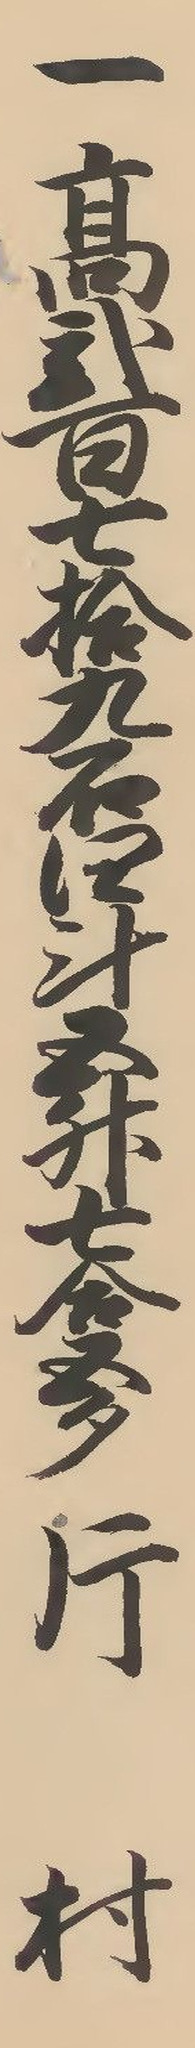一髙弐百七拾九石四斗五升七合五夕片村

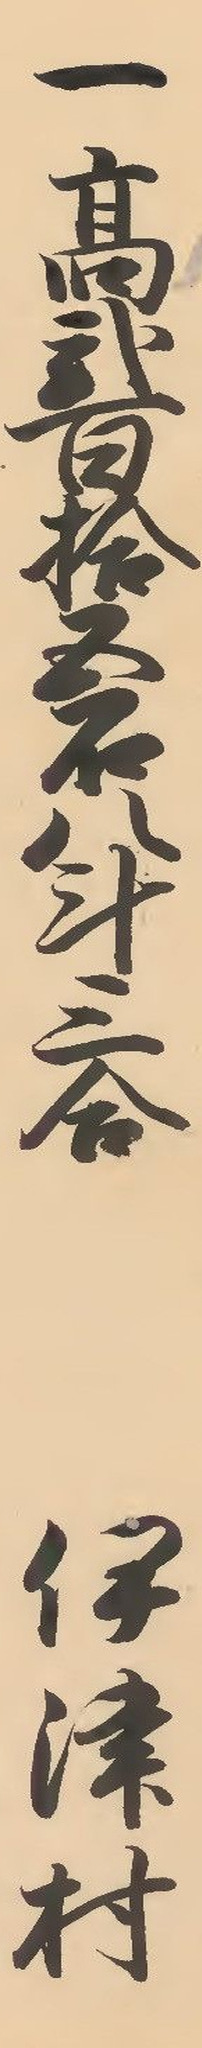一髙弐百拾五石八斗三合伊津村
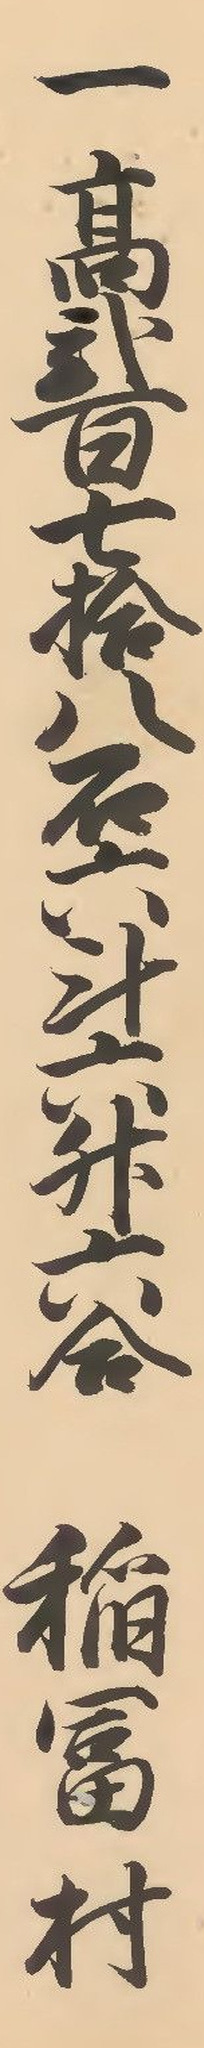一髙弐百七拾八石六斗六升六合稲冨村
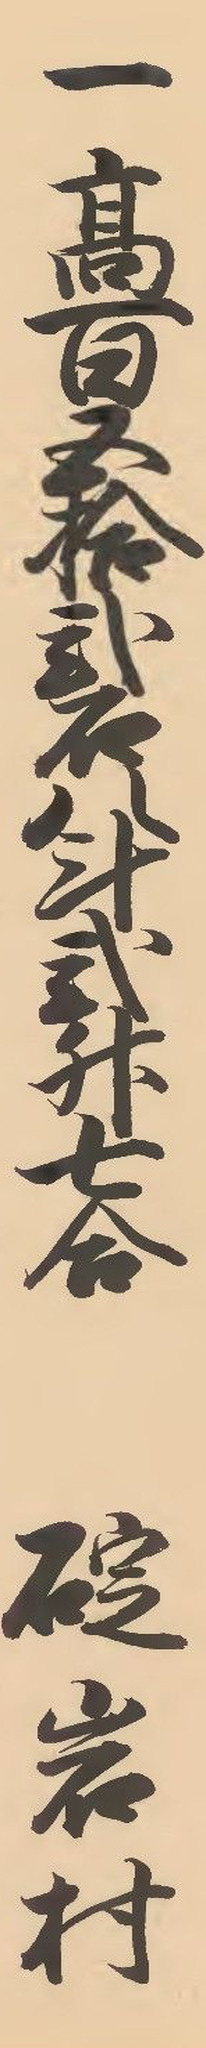一髙百五拾弐石八斗弐升七合碇岩村
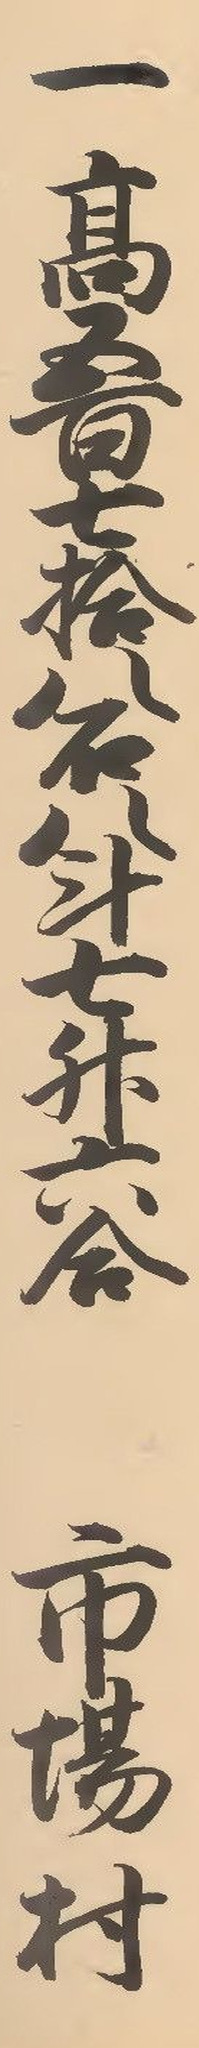一髙五百七拾八石八斗七升六合市場村
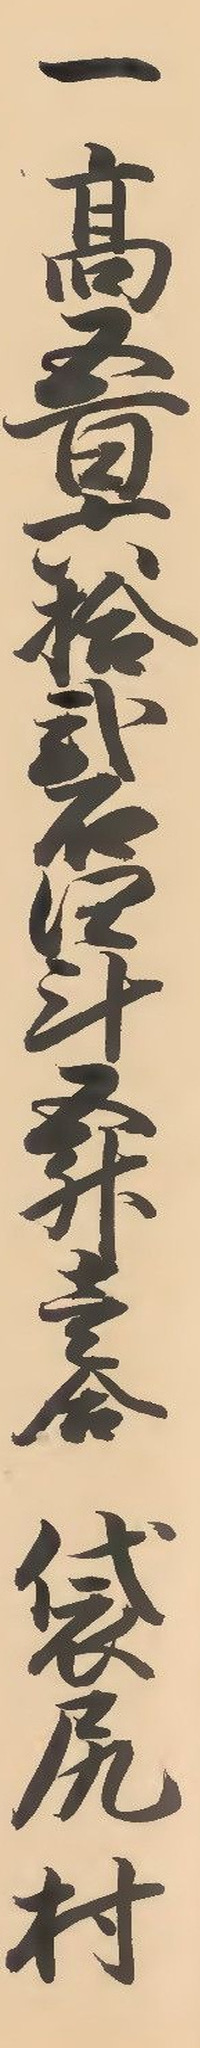一髙五百六拾弐石四斗五升壱合袋尻村
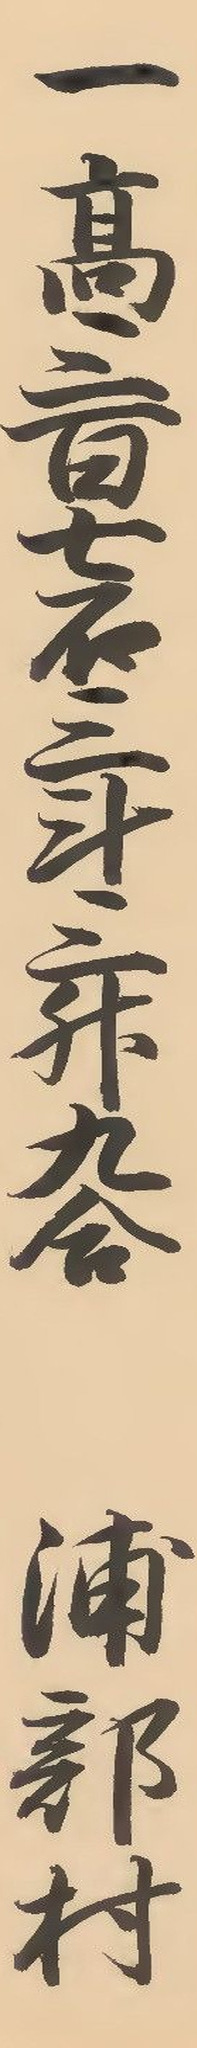一髙三百七石三斗三升九合浦部村
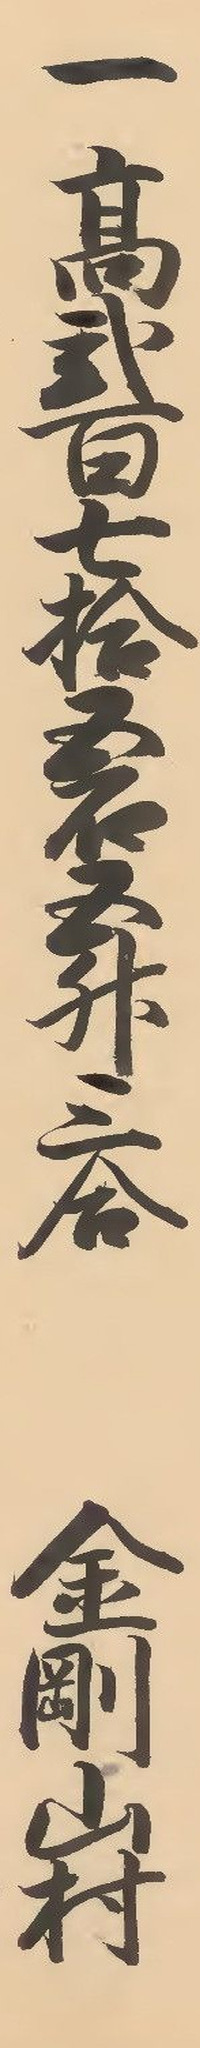一髙弐百七拾五石五升三合金剛山村
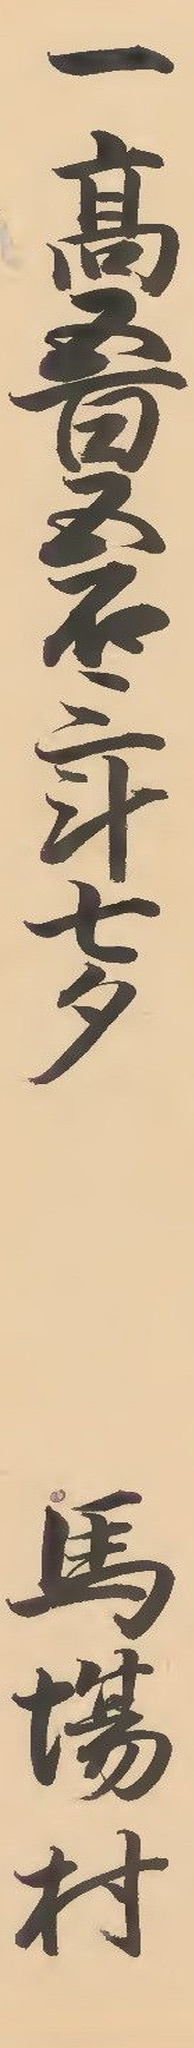一髙五百五石三斗七夕馬場村

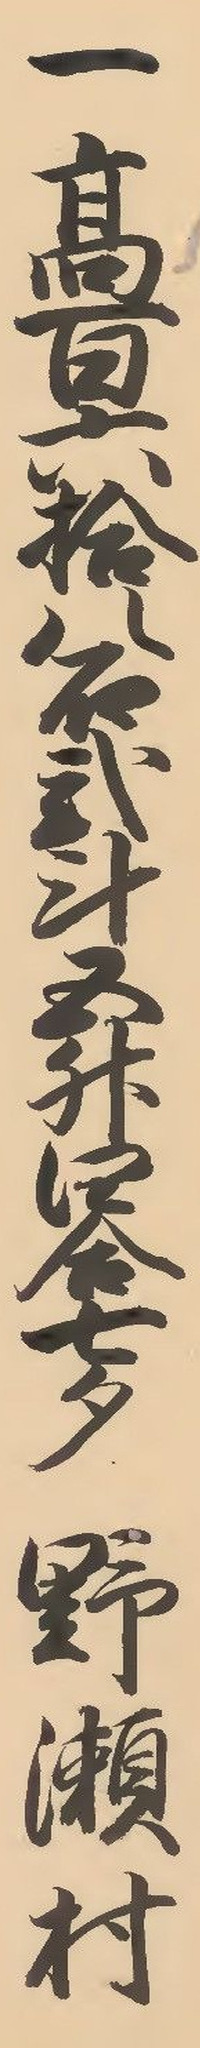一髙百六拾八石弐斗五升四合七夕野瀬村
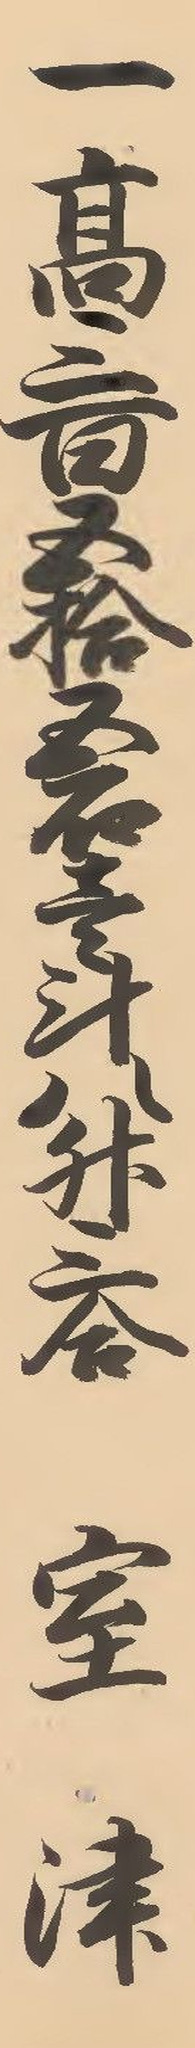一髙三百五拾五石壱斗八升三合室津
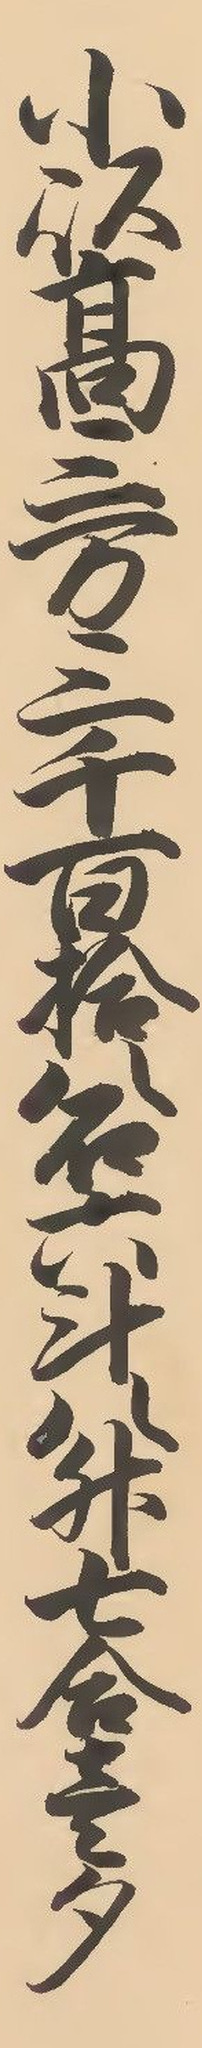小以髙三万三千百拾八石六斗八升七合壱夕
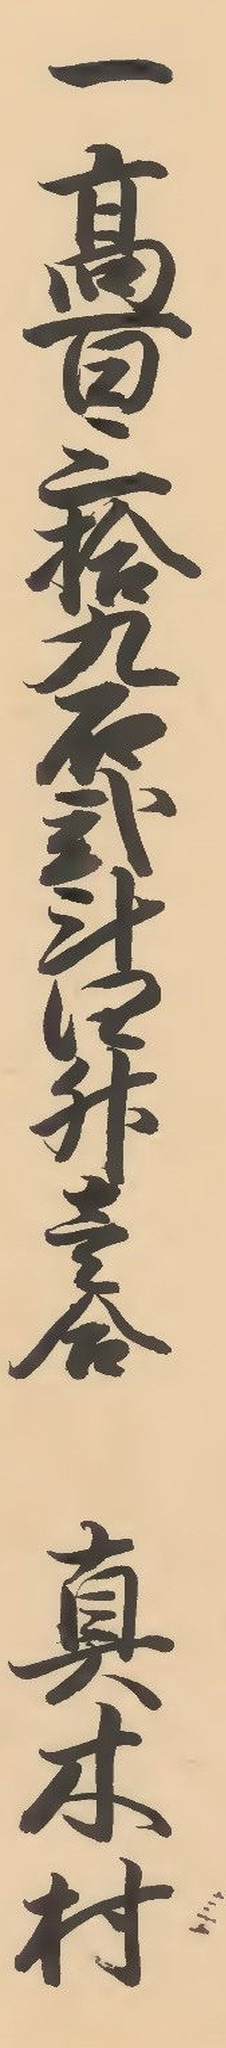一髙百三拾九石弐斗四升壱合真木村
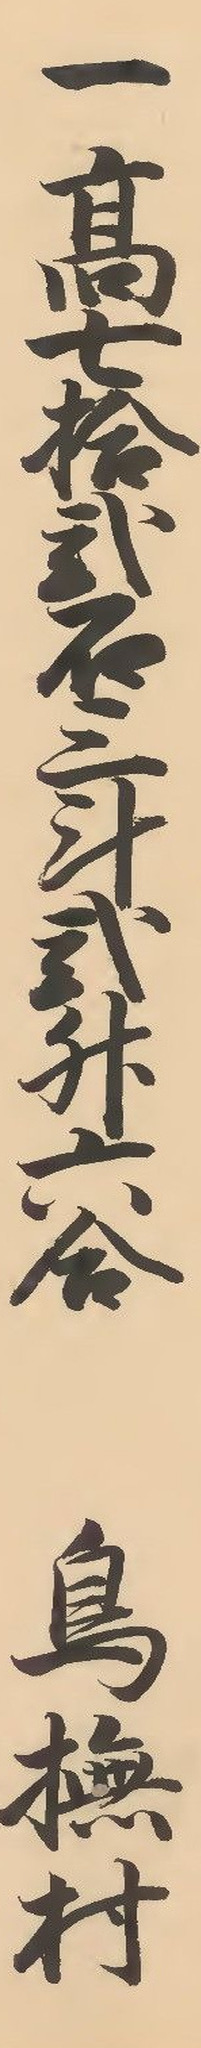一髙七拾弐石三斗弐升六合鳥撫村
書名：播磨国郷帳
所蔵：国立公文書館 National Archives of Japan
